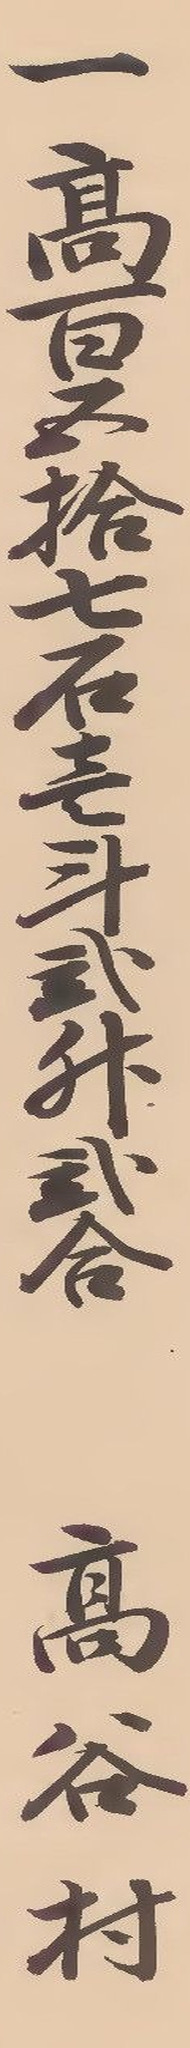一高百五拾七石壱斗弐升弐合高谷村
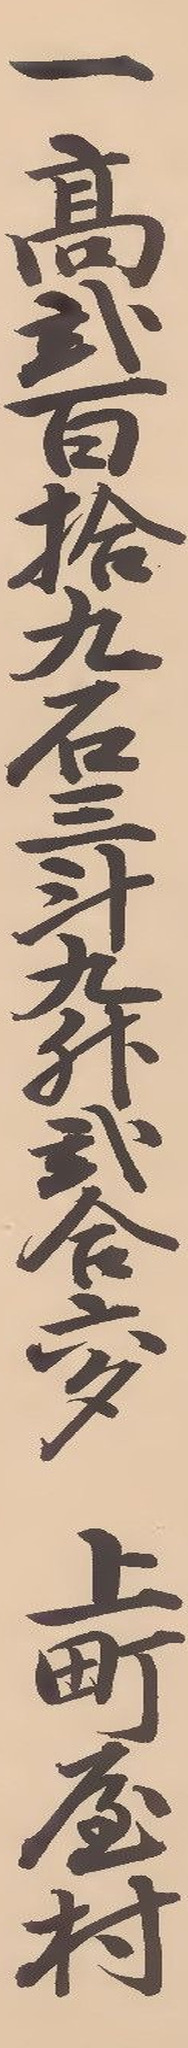一高弐百拾九石三斗九升弐合六勺上町屋村
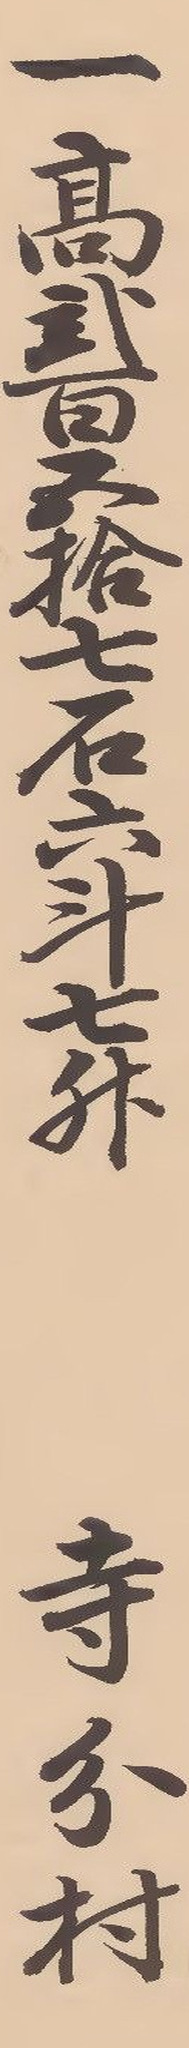一高弐百五拾七石六斗七升寺分村
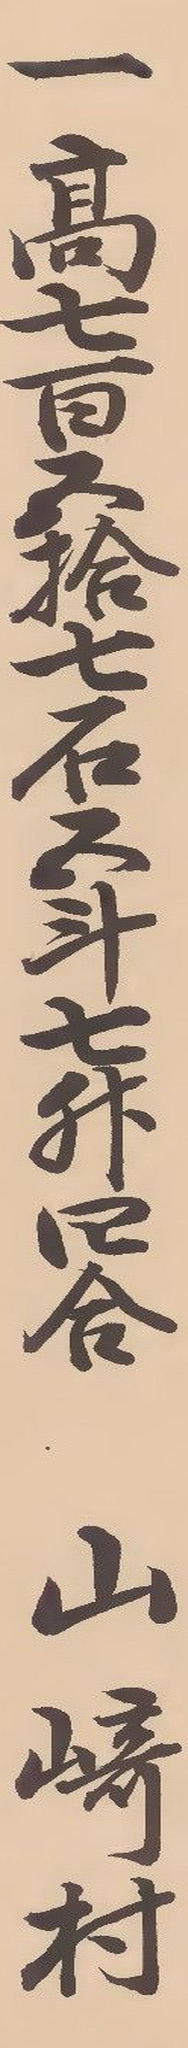一高七百五拾七石五斗七升四合山崎村
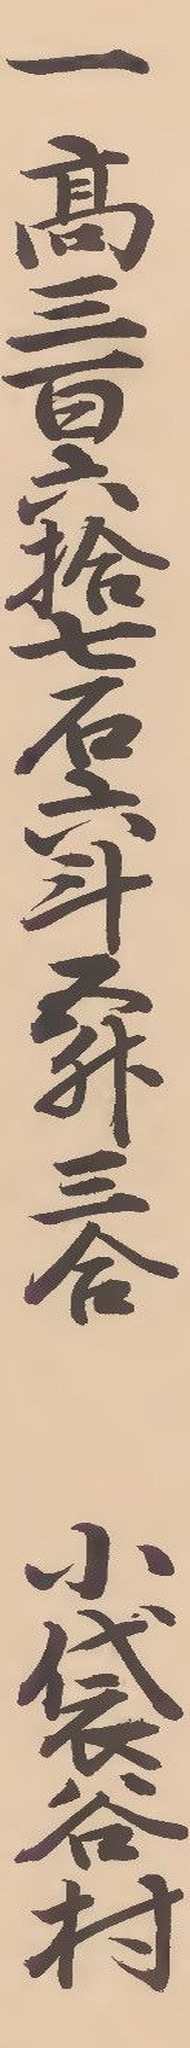一高三百六拾七石六斗五升三合小袋谷村

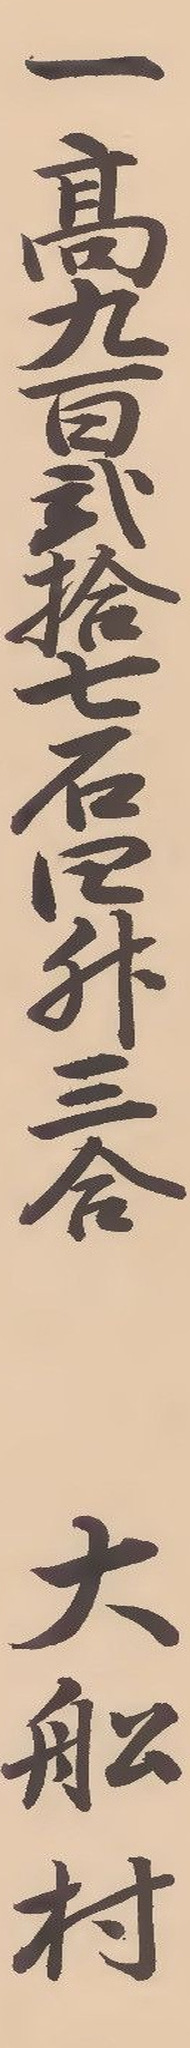一高九百弐拾七石四升三合大舩村
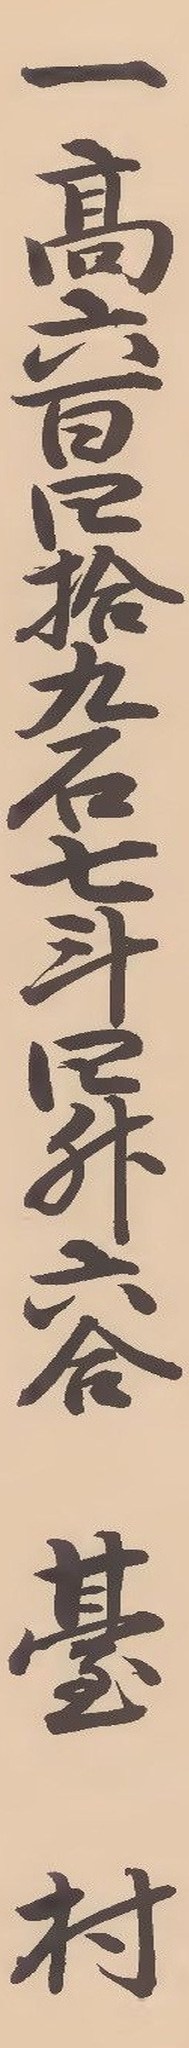一高六百四拾九石七斗四升六合䑓村

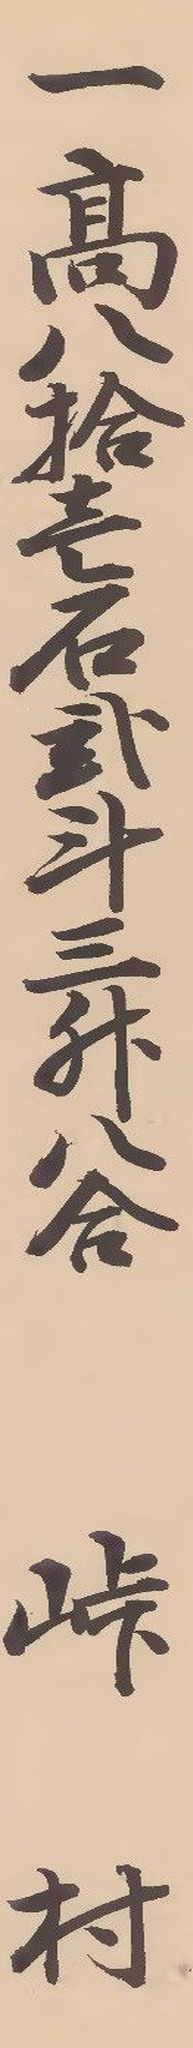一高八拾壱石弐斗三升八合峠村
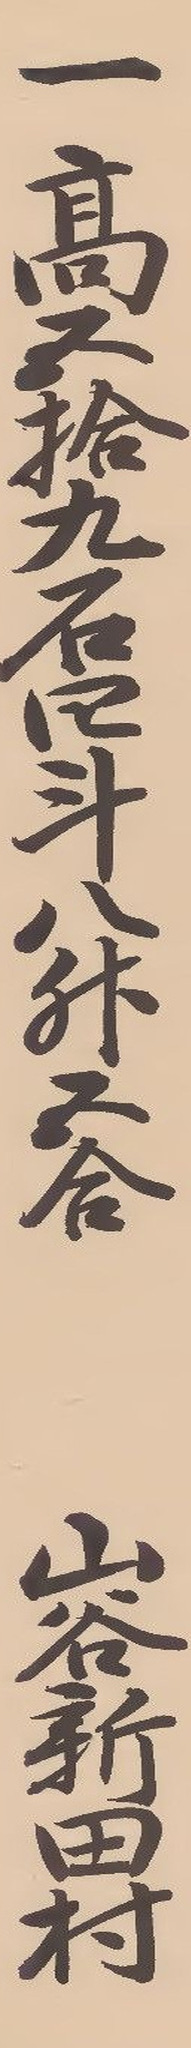一高五拾九石四斗八升五合山谷新田村
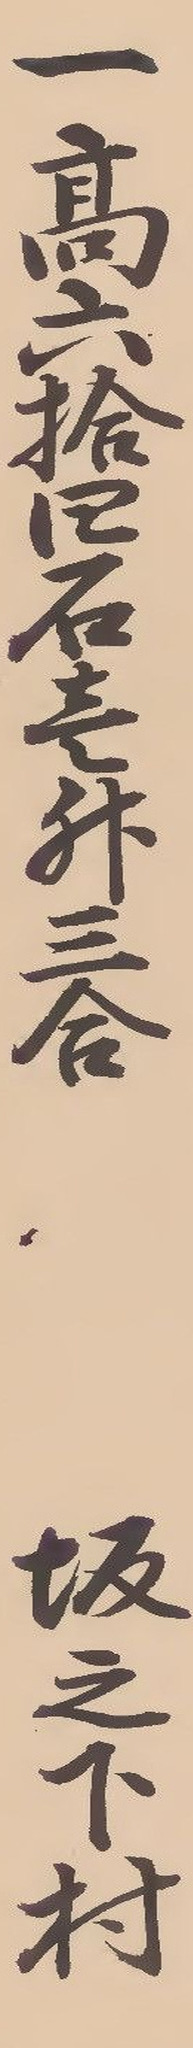一高六拾四石壱升三合坂之下村

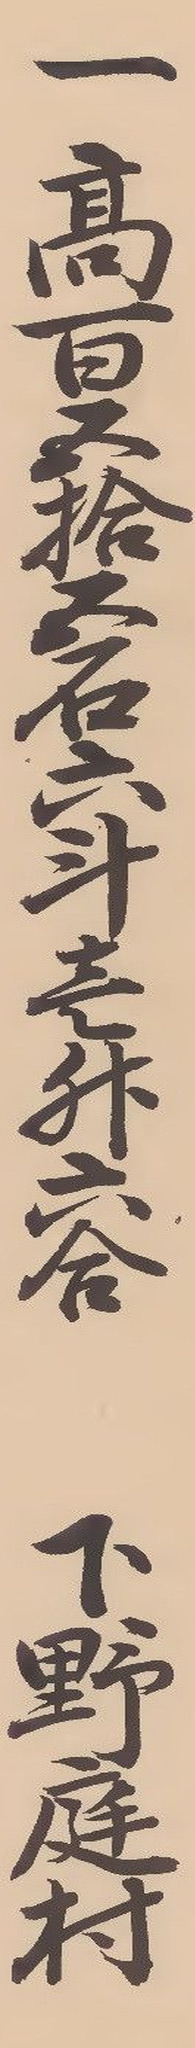一高百五拾五石六斗壱升六合下野庭村
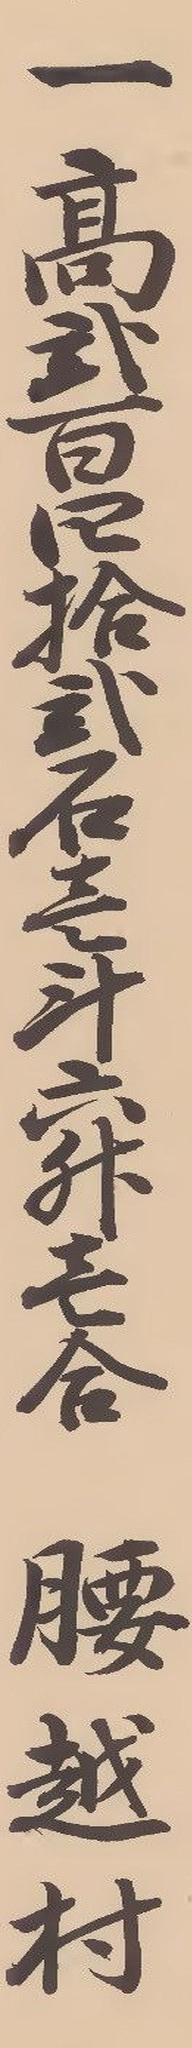一高弐百四拾弐石壱斗六升壱合腰越村
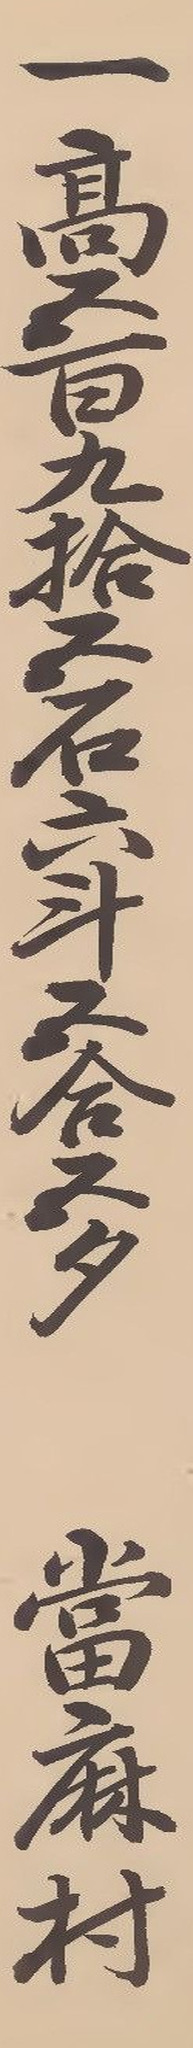一高五百九拾五石六斗五合五勺當麻村
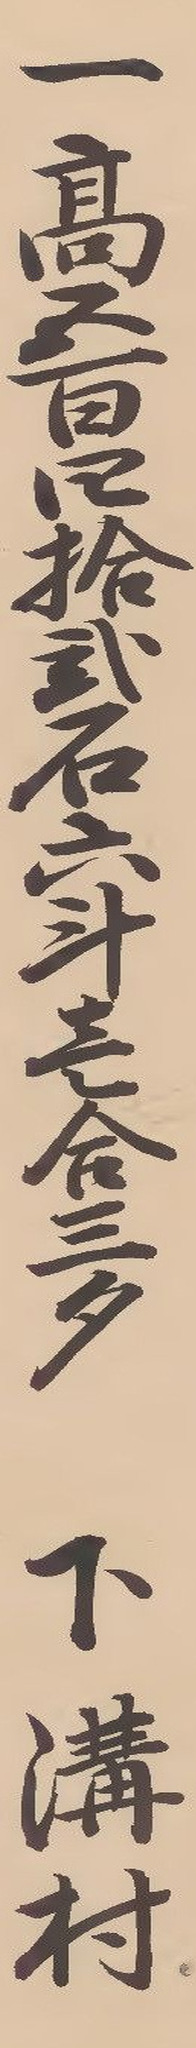一高五百四拾弐石六斗壱合三勺下溝村
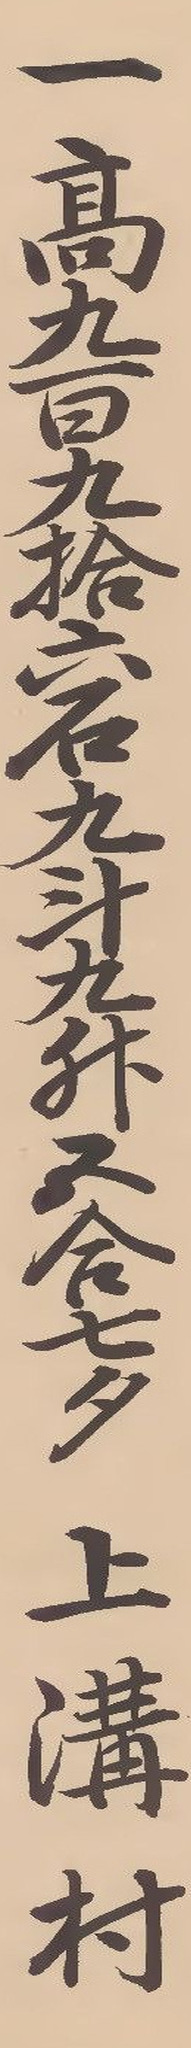一高九百九拾六石九斗九升五合七勺上溝村
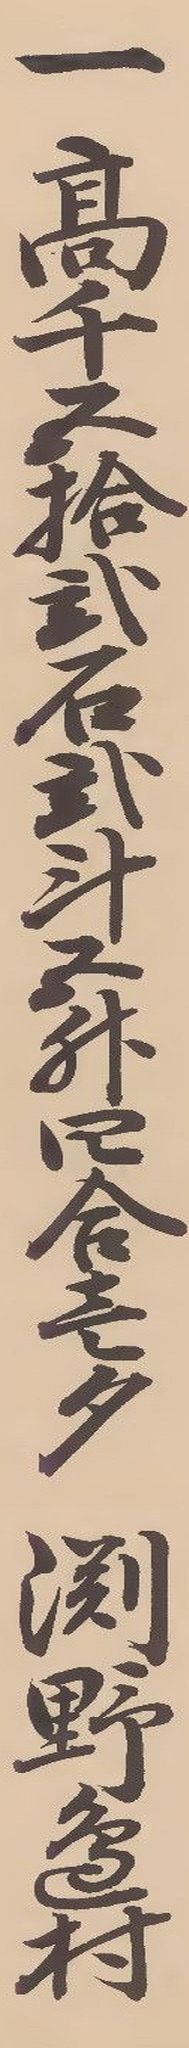一高千五拾弐石弐斗五升四合壱勺渕野邊村
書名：相模国郷帳
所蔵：国立公文書館 National Archives of Japan
